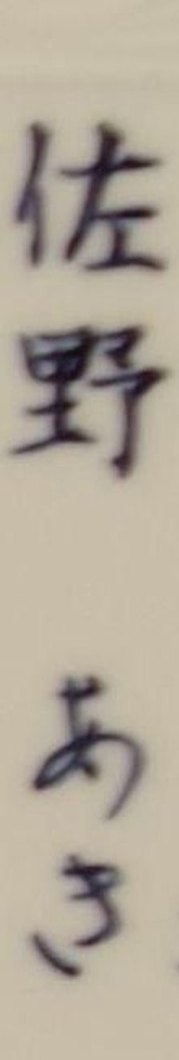佐野あき
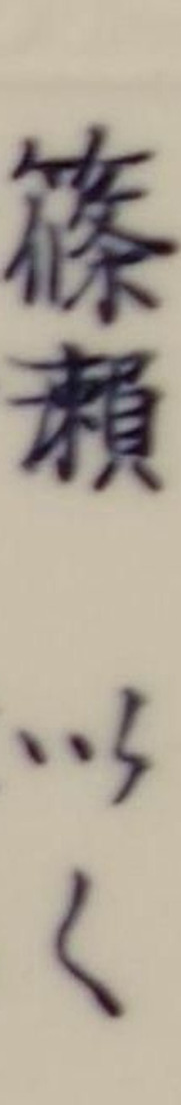篠頼いく
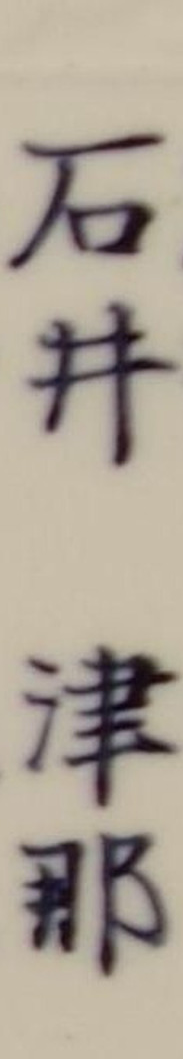石井津那
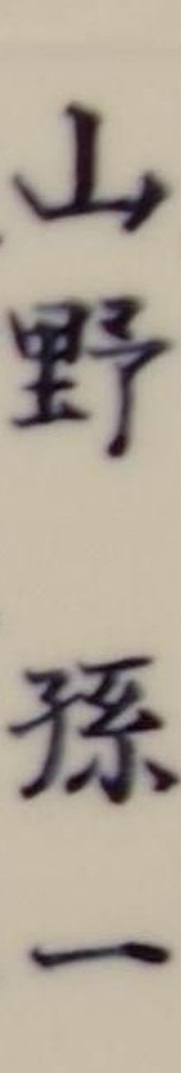山野孫一
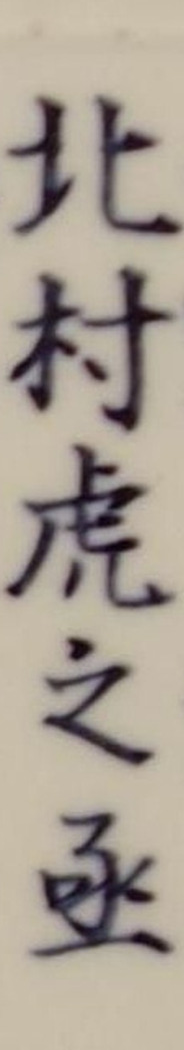北村虎之丞
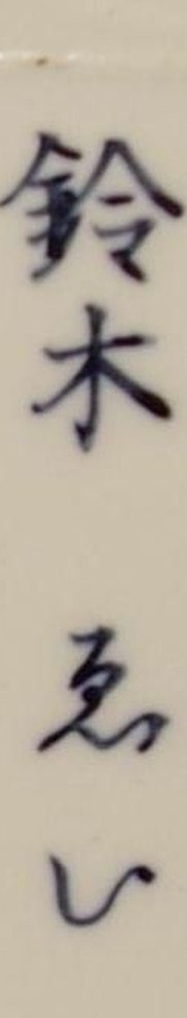鈴木ゑい
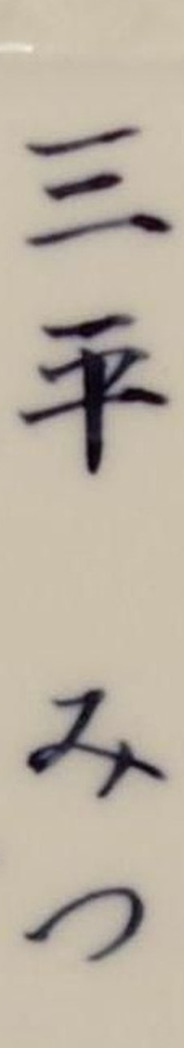三平みつ
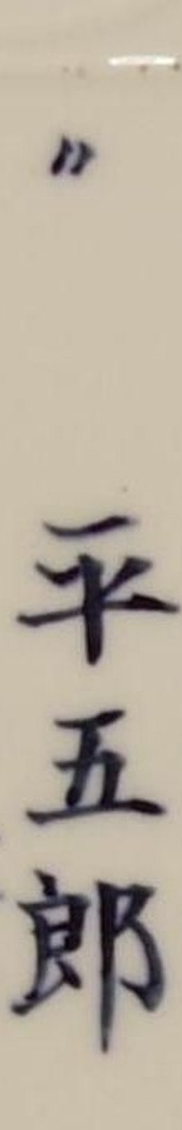平五郎
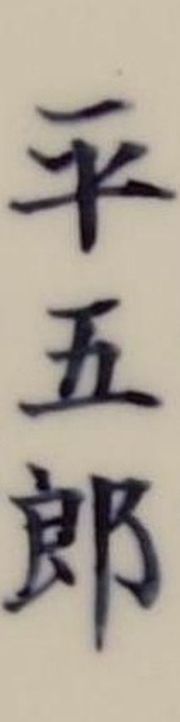平五郎
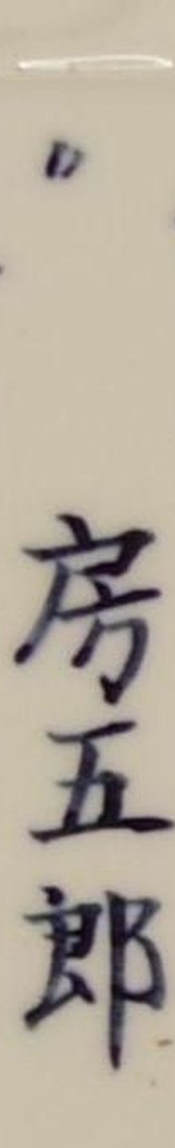房五郎
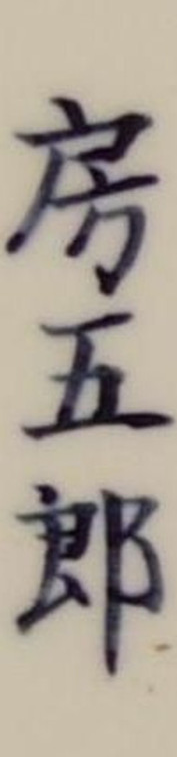房五郎
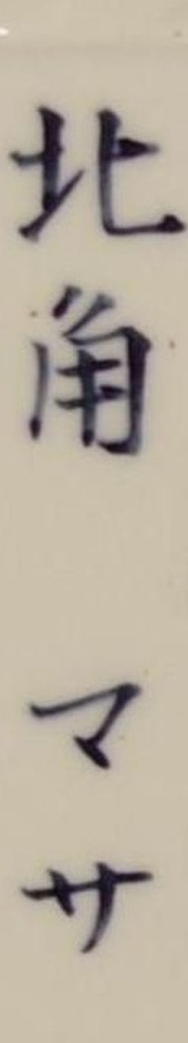北角マサ
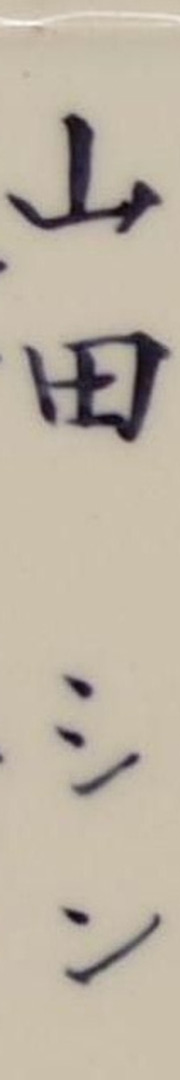山田シン
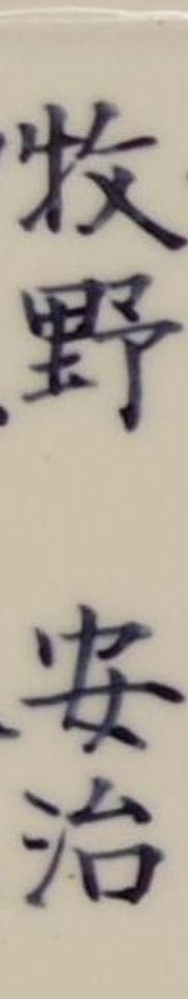牧野安治
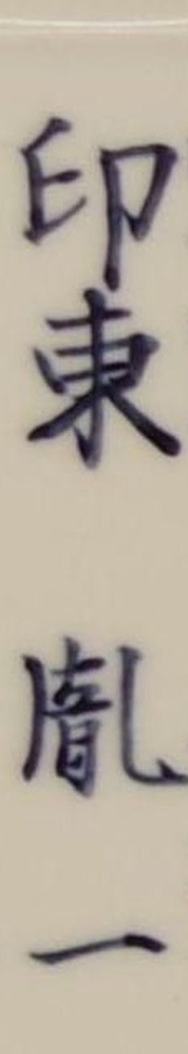印東胤一
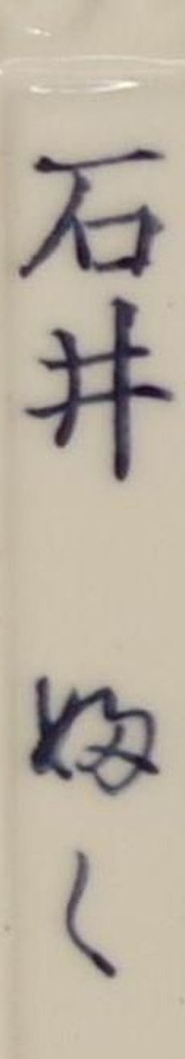石井ふく
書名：M~S
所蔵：高野山金剛峯寺
